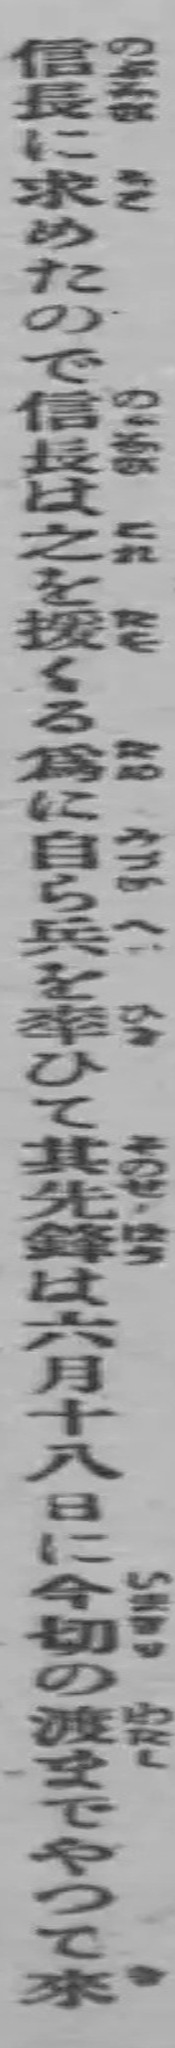信長に求めたので信長は之を援くる為に自ら兵を率ひて其先鋒は六月十八日に今切の渡までやつて来
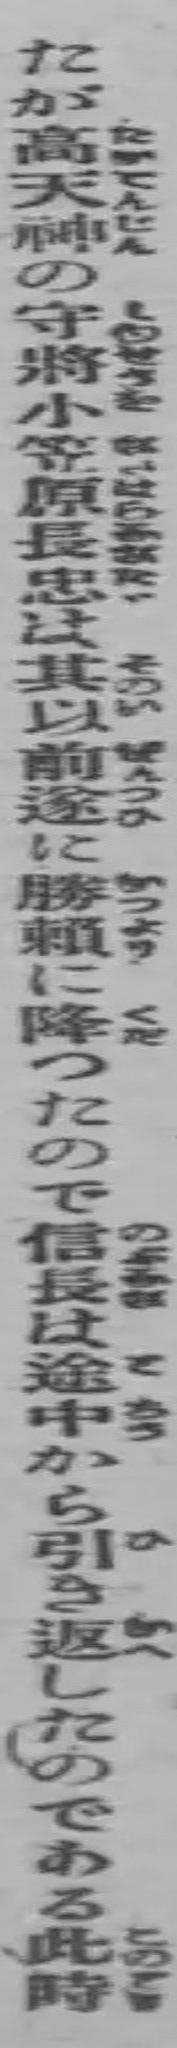たが高天神の守将小笠原長忠は其以前遂に勝頼に降つたので信長は途中から引き返したのである此時
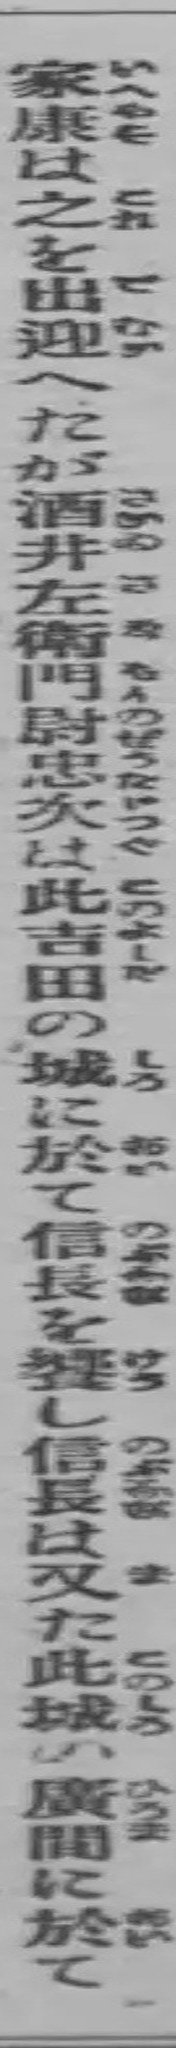家康は之を出迎へたが酒井左衛門尉忠次は此吉田の城に於て信長を饗し信長は又た此城の広間に於て
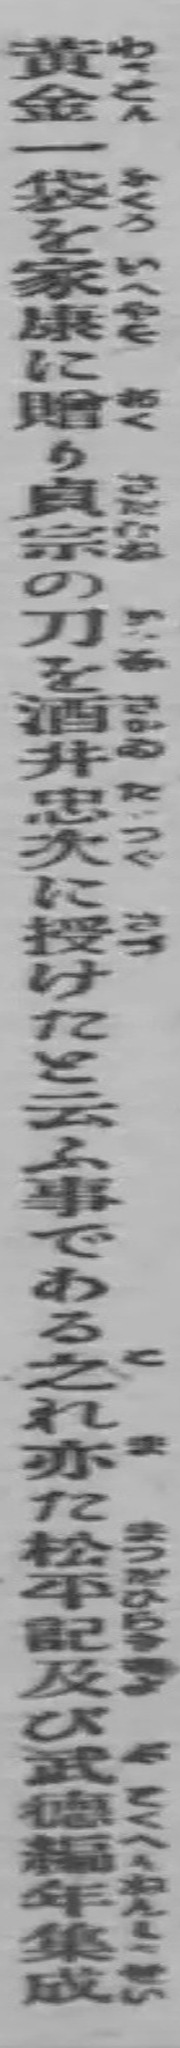黄金一袋を家康に贈り貞宗の刀を酒井忠次に授けたと云ふ事である之れ亦た松平記及び武徳編年集成
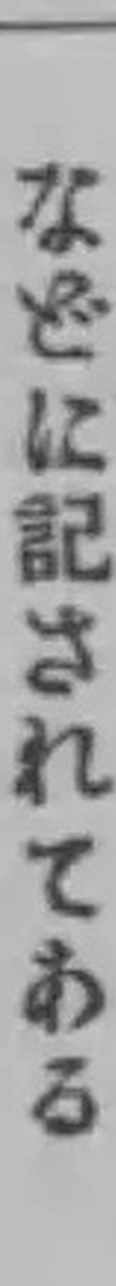などに記されてある
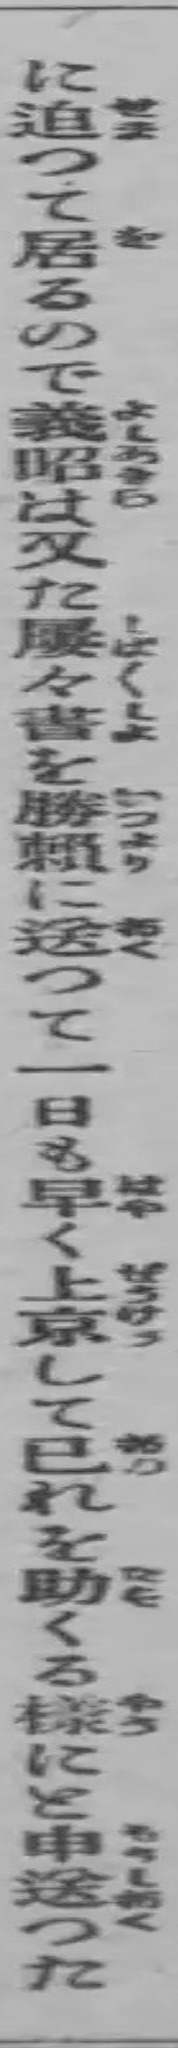軍との関係に迫つて居るので義昭は又た屡々書を勝頼に送つて一日も早く上京して己れを助くる様にと申送つた
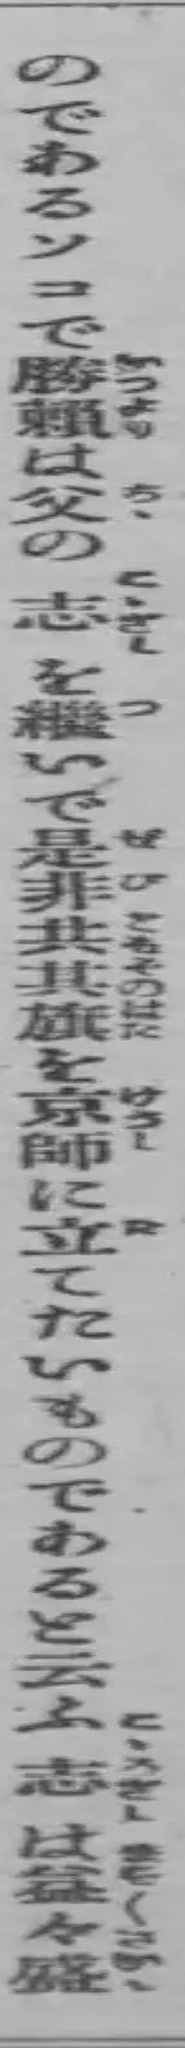のであるソコで勝頼は父の志を継いで是非共其旗を京師に立てたいものであると云ふ志は益々盛
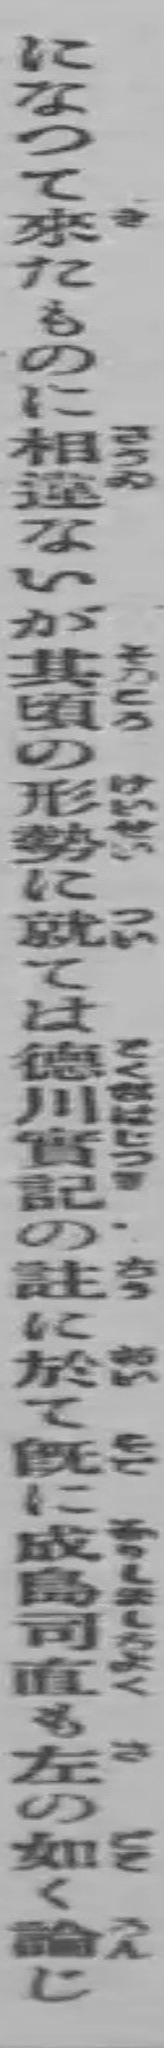になつて来たものに相違ないが其頃の形勢に就ては徳川実記の註に於て既に成島司直も左の如く論じ
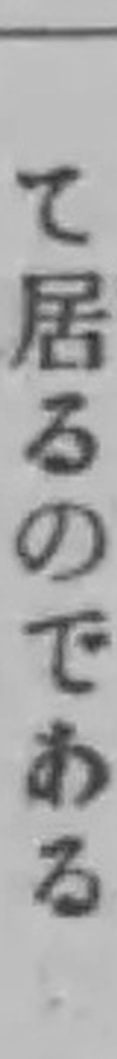て居るのである
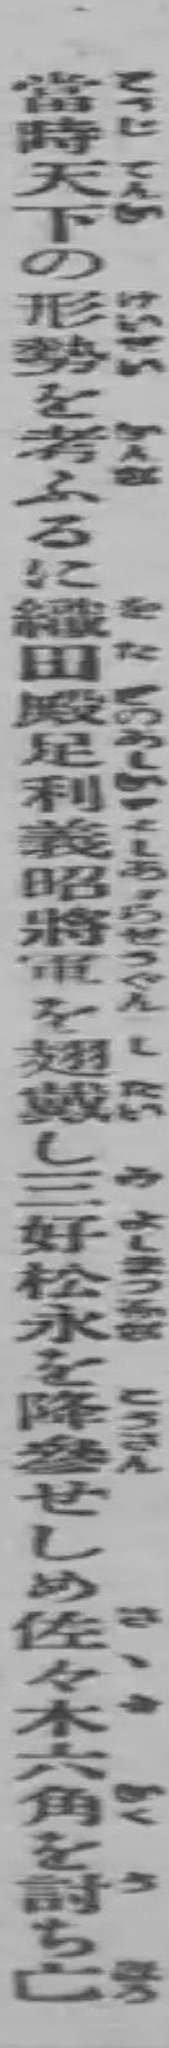当時天下の形勢を考ふるに織田殿足利義昭将軍を̪翅戴し三好松永を降参せしめ佐々木六角を討ち亡
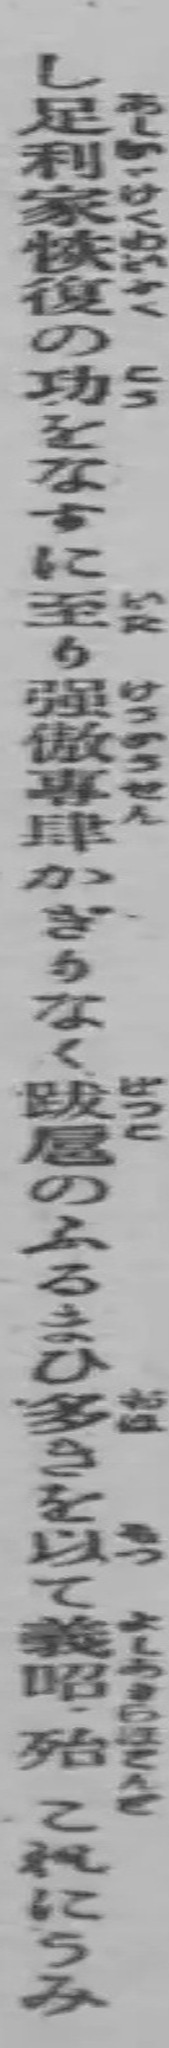し足利家恢復の功をなすに至り強傲専肆かぎりなく跋扈のふるまひ多きを以て義昭殆これにうみ
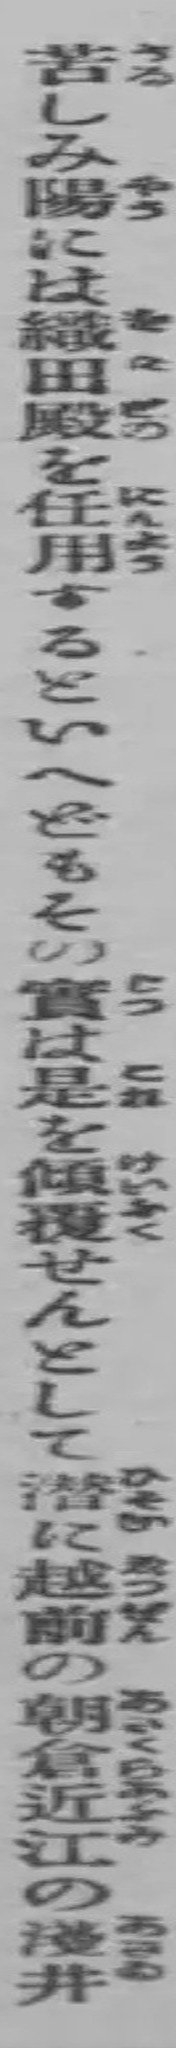苦しみ陽には織田殿を任用するといへどもその実は是を傾覆せんとして潜に越前の朝倉近江の浅井
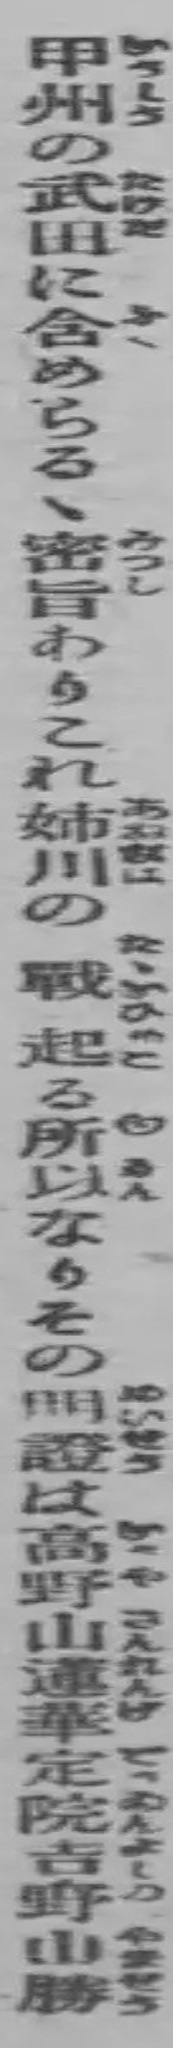甲州の武田に含めらるゝ密旨ありこれ姉川の戦起る所以なりその明証は高野山蓮華定院吉野山勝
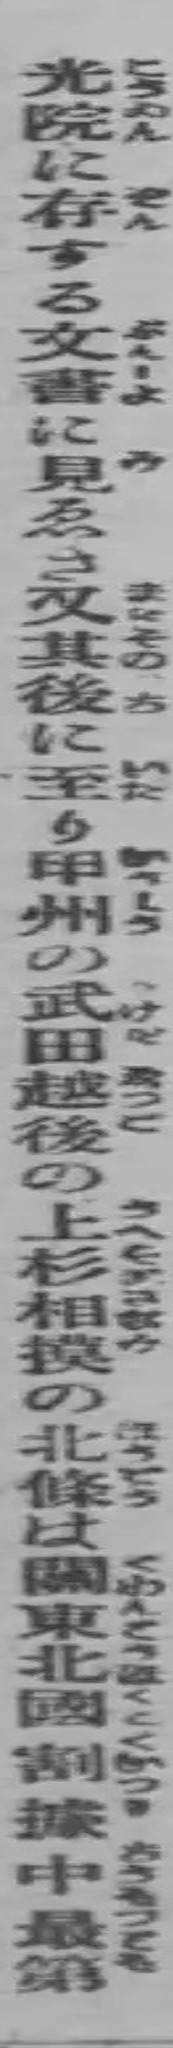光院に存する文書に見ゑさ又其後に至り甲州の武田越後の上杉相模の北条は関東北国割拠中最第

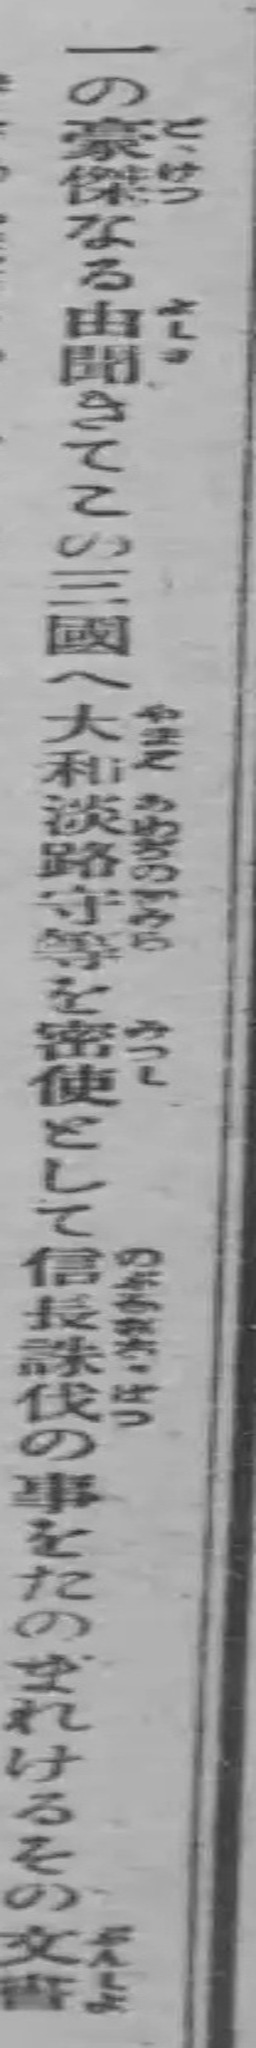一の豪傑なる由聞きてこの三国へ大和淡路守等を密使として信長誅伐の事をたのまれけるその文書
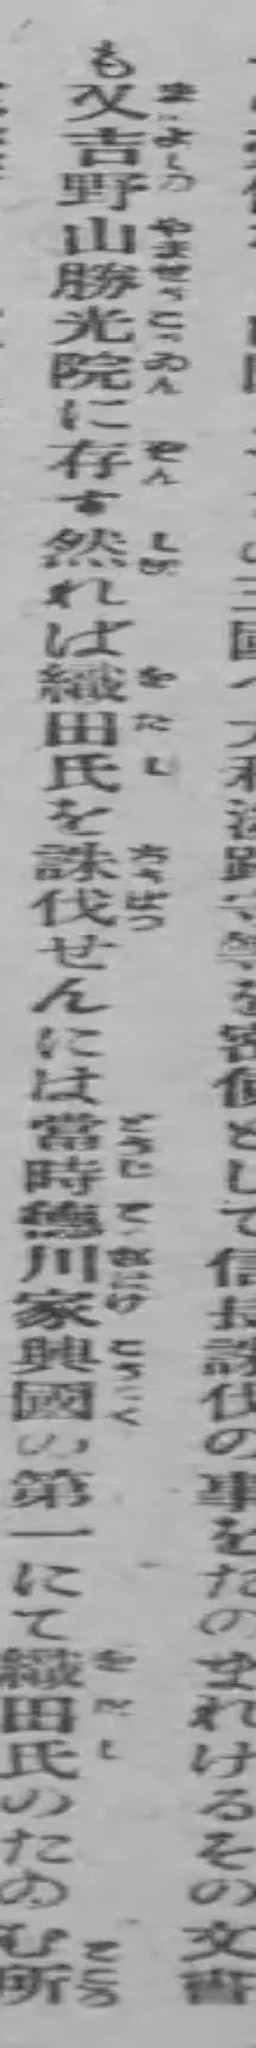も又吉野山勝光院に存す然れば織田氏を誅伐せんには当時徳川家興国の第一にて織田氏のたのむ所
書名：豊橋市史談
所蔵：国立国会図書館 National Diet Library, JAPAN
